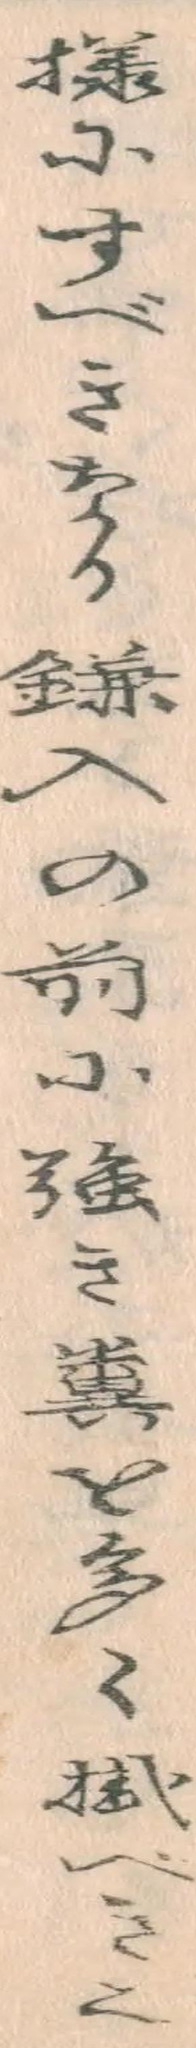様にすべきなり鎌入の前に強き糞を多く掛べき也
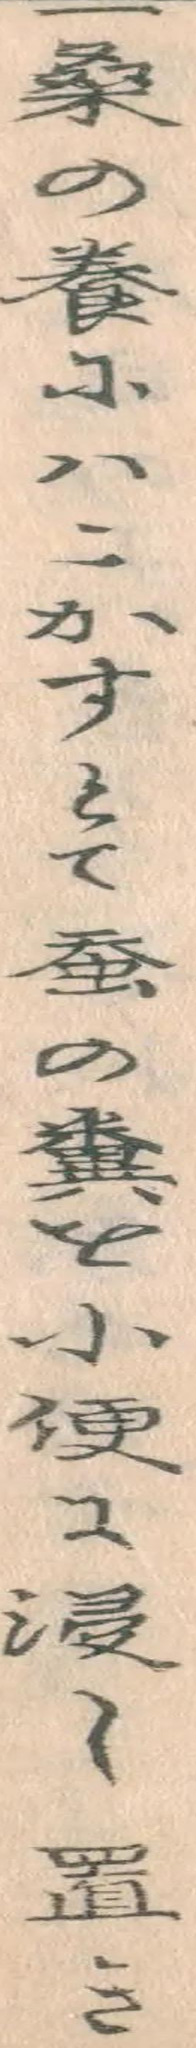一桑の養にはこかすとて桑の糞を小便に浸し置き
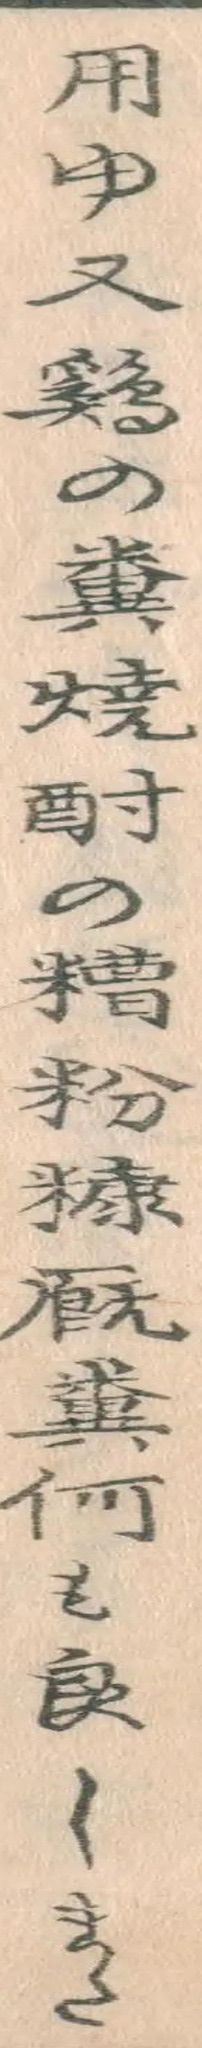用ゆ又鶏の糞焼酎の糟粉糠厩糞何も良しまた
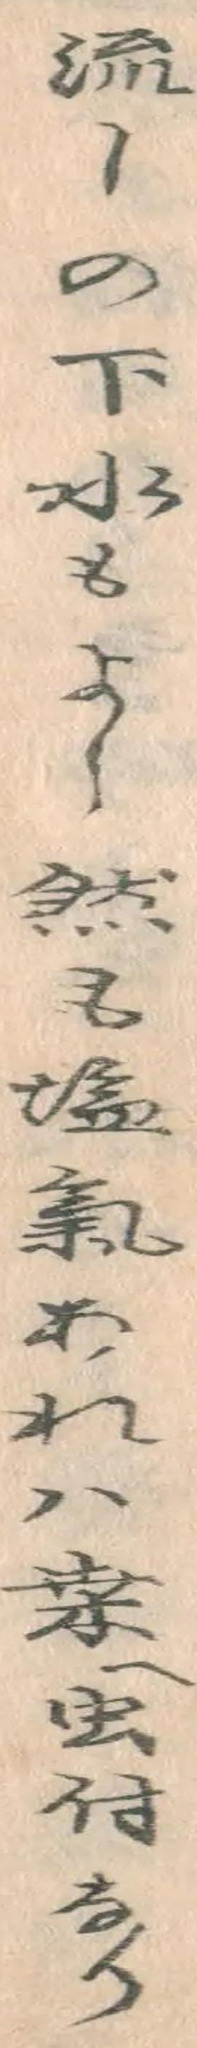流しの下水もよし然も塩気あれは桑へ虫付なり
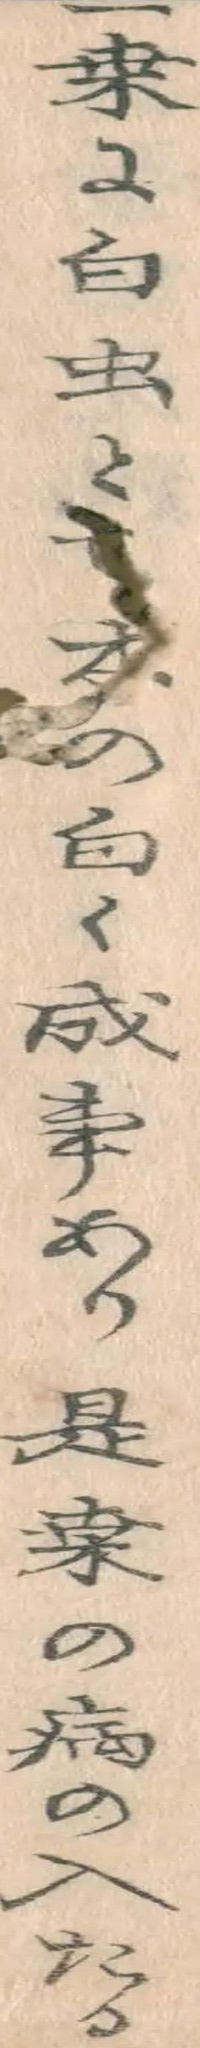一桑に白虫とて本の白く成事あり是桑の病の入たる
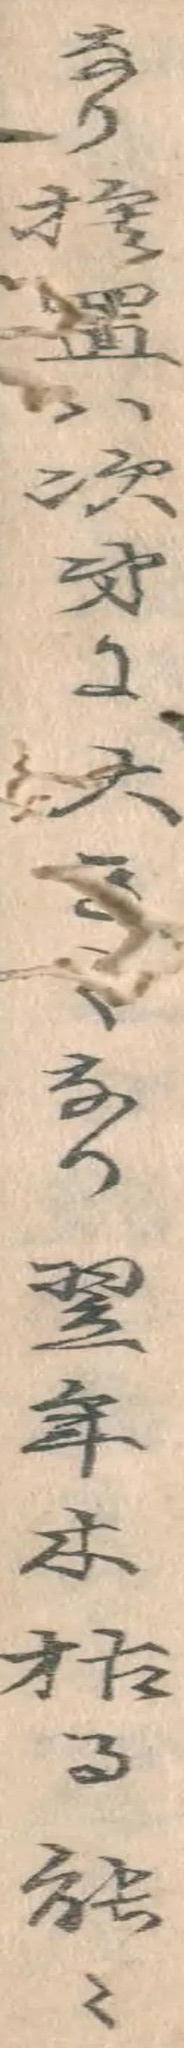なり捨置は次第に大きくなり翌年木枯る能々

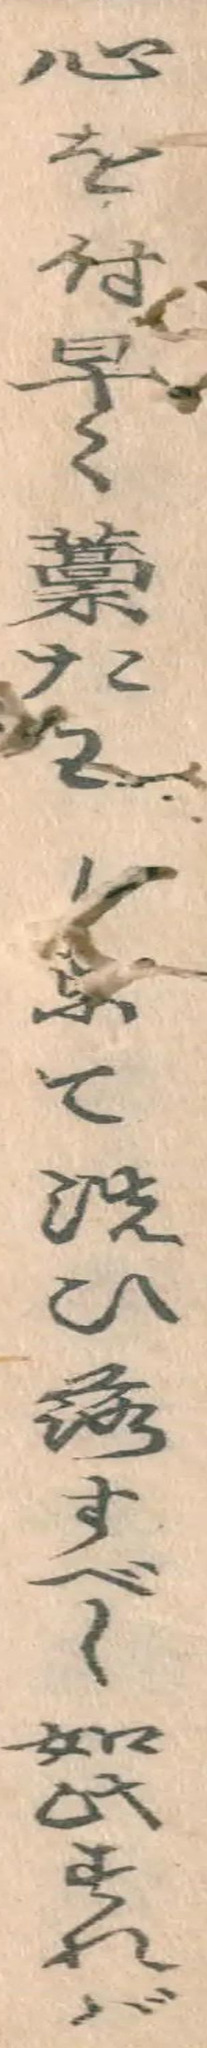心を付早く藁たわしにて洗ひ落すべし如此すれば
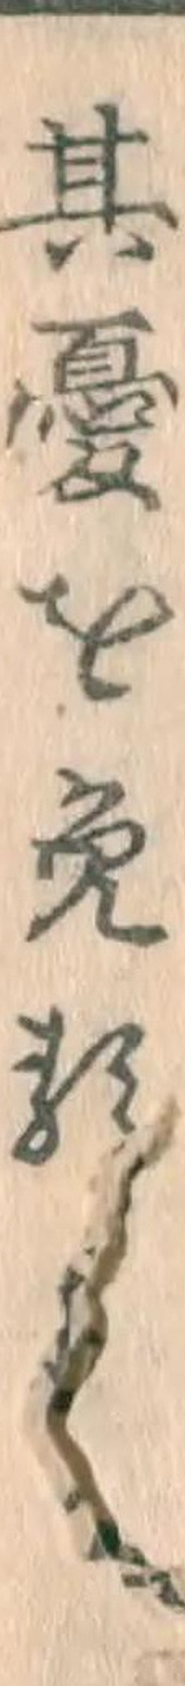其憂を免る
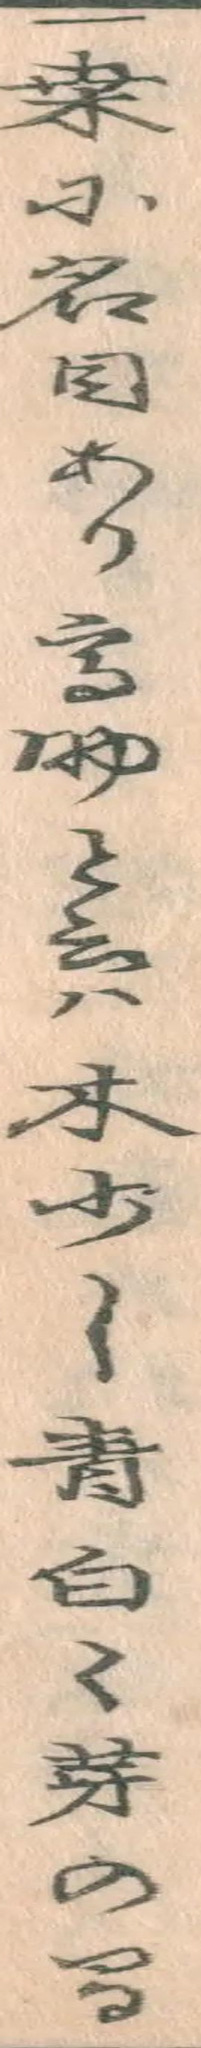一桑に名目あり高助と云は木少し青白く芽の間
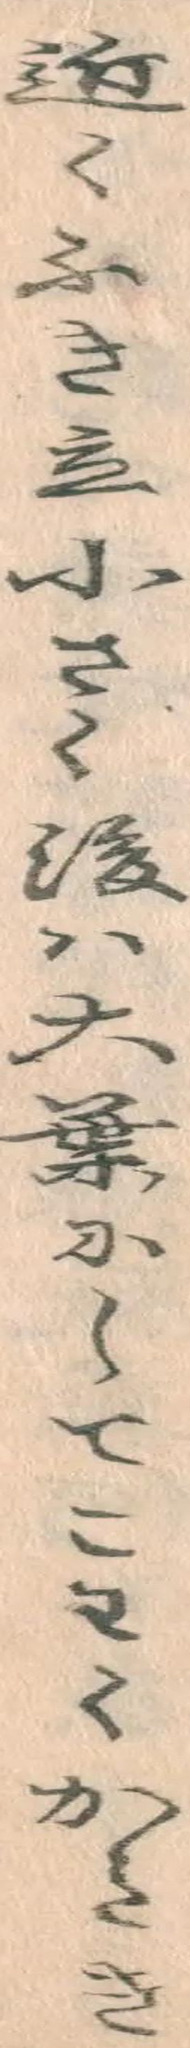近くふき立小さく後は大葉にしてこわくかたき
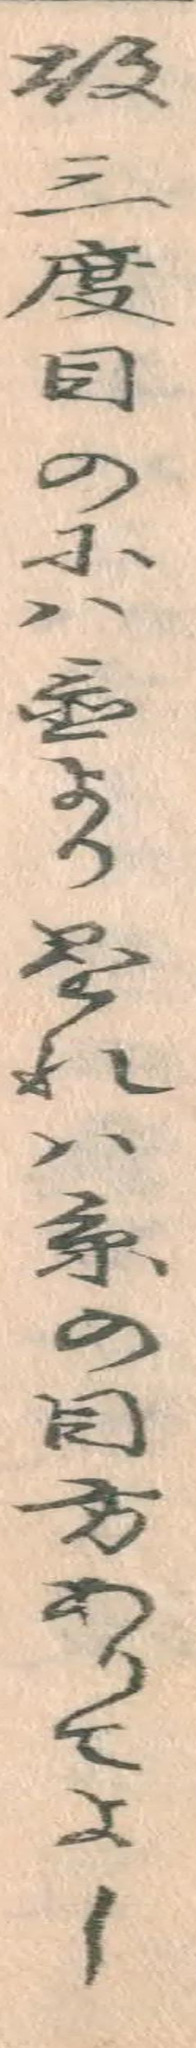故三度目のには置より懸れは糸の目方ありてよし
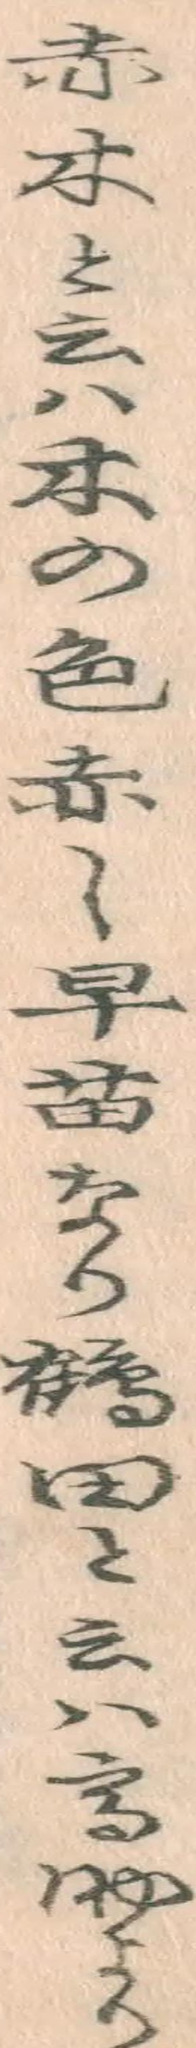赤木と云は木の色赤し早苗なり鶴田と云は高助より
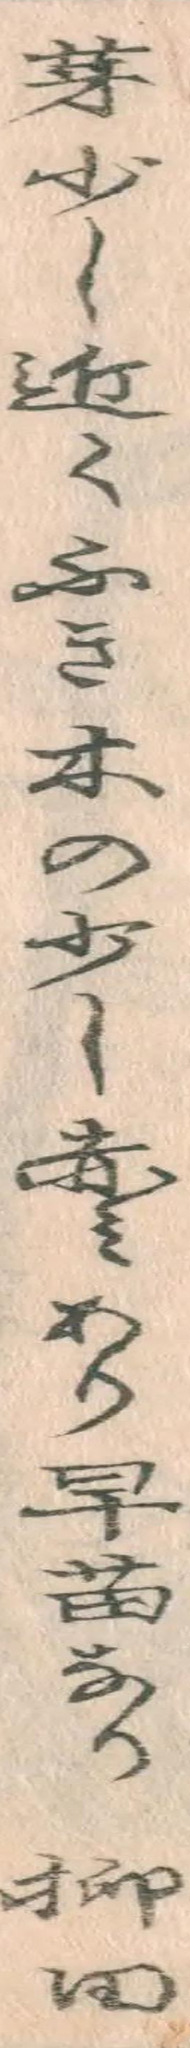芽少し近くふき木の少し赤みあり早苗なり柳田
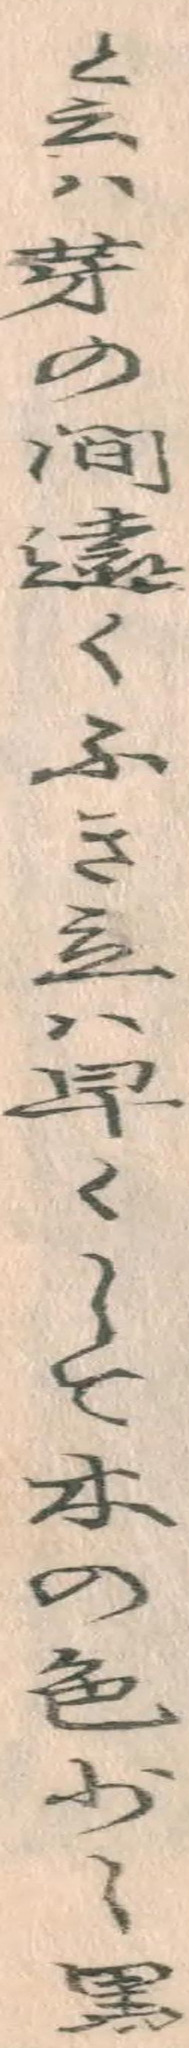と云は芽の間遠くふき立は早くして木の色少し黒
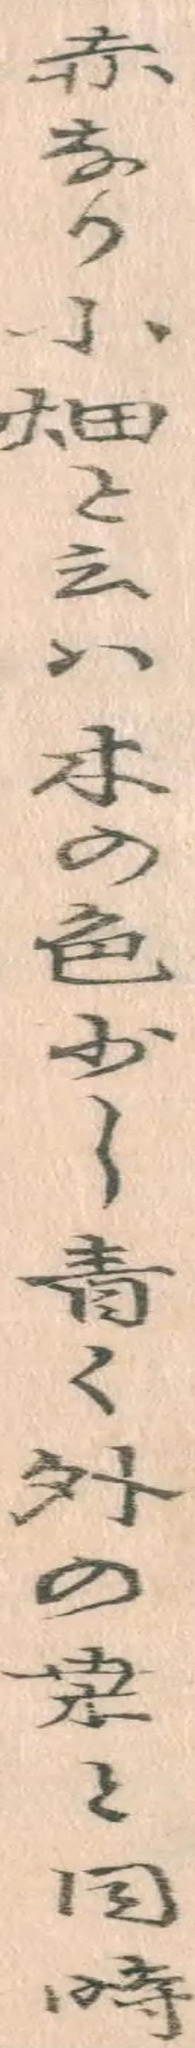赤なり小畑と云は木の色少し青く外の桑と同時
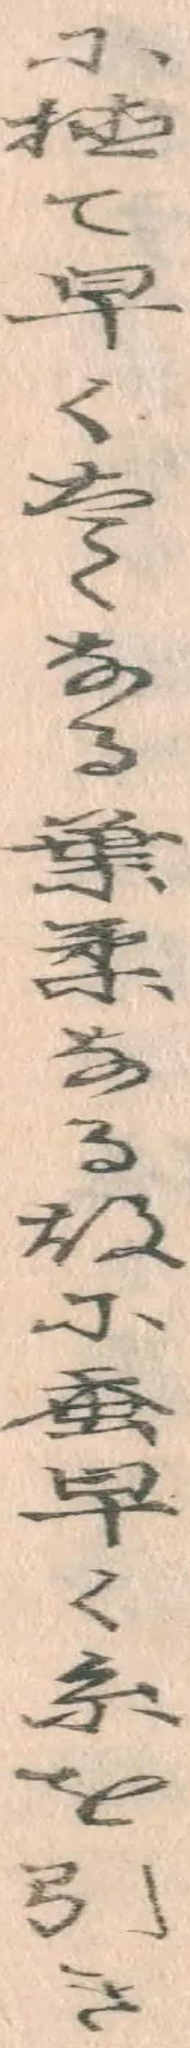に植て早く太くなる葉柔なる故に蚕早く糸を引き
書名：機織彙編 5巻. [1]
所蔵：国立国会図書館 National Diet Library, JAPAN
